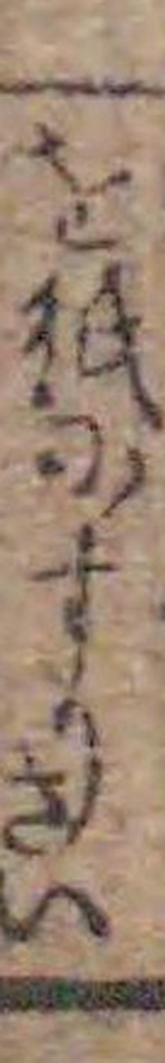を紙にすりさい
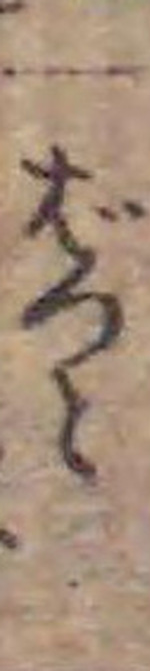ばつと
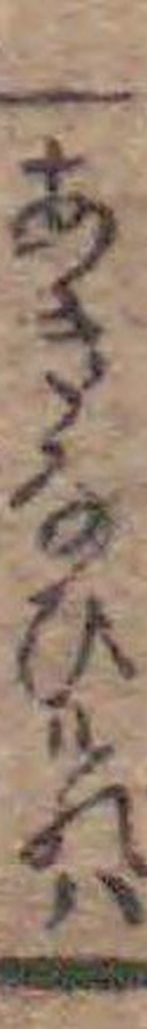あきなひけれは
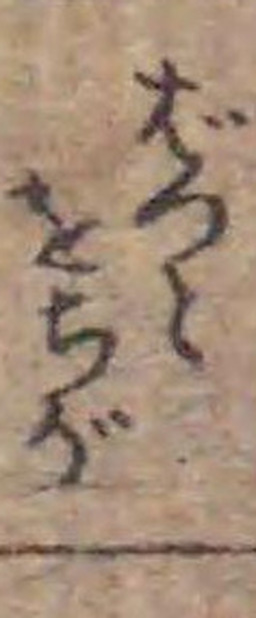をちが
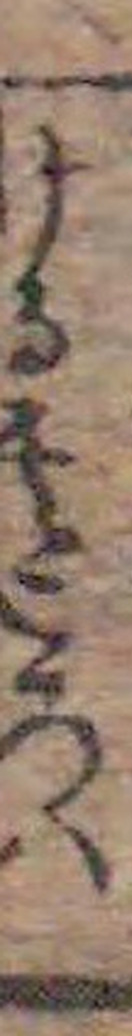ける其ころは
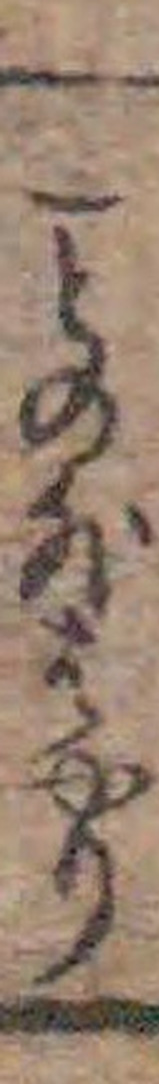ことの外はやり
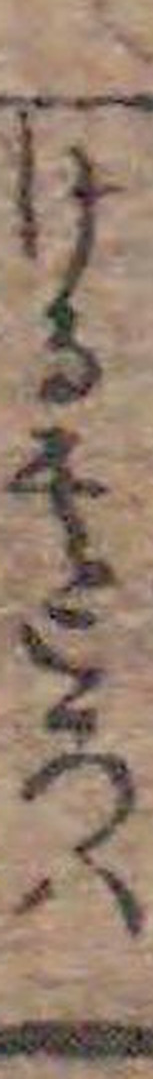ける其ころは
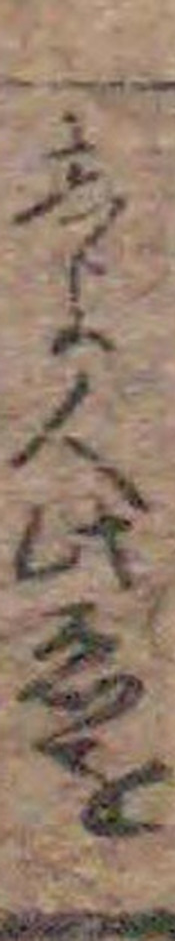しよ人このゑを
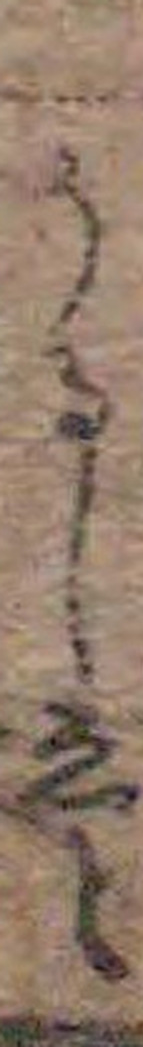うるしゑと
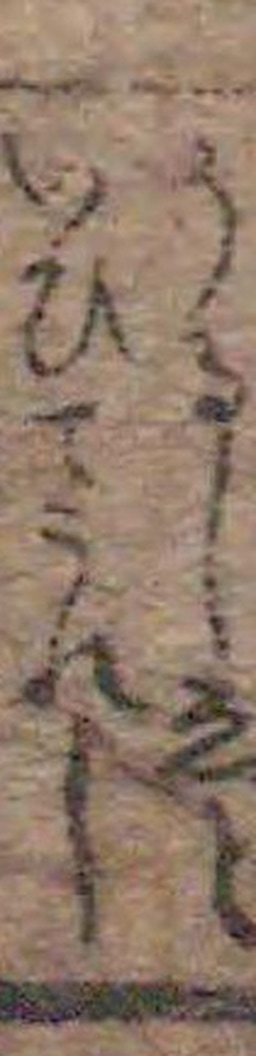いひてうれし
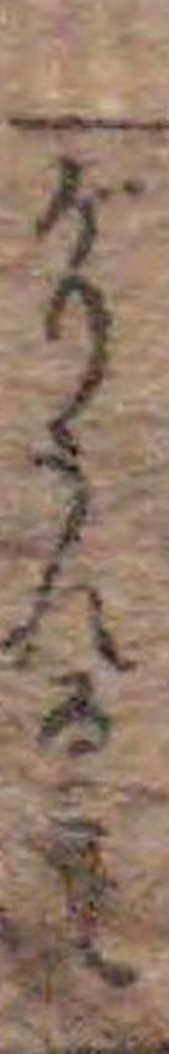がりうれること
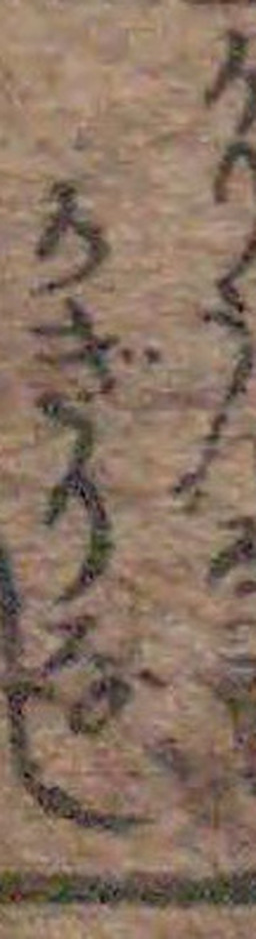かぎりなし
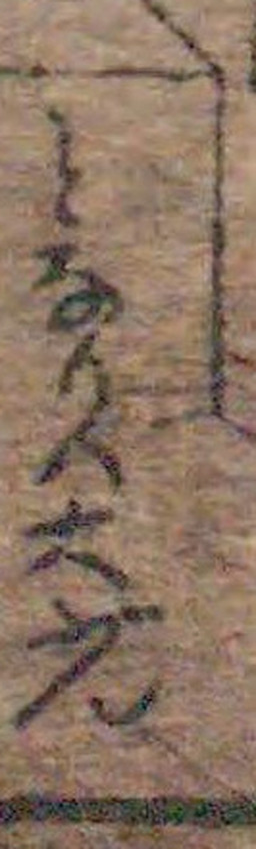となりは大ぶん
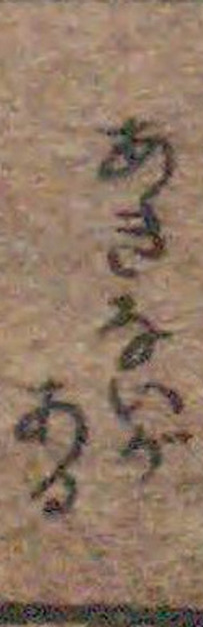あきないが
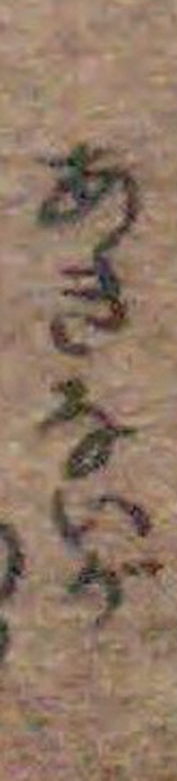あきないが
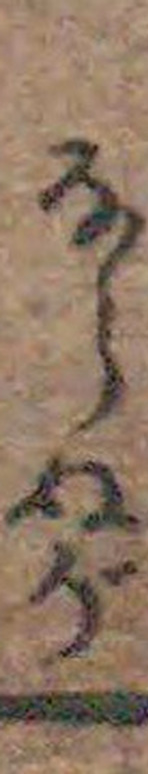ならぬが
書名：三舛増鱗組 : 3巻
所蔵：国立国会図書館 National Diet Library, JAPAN
